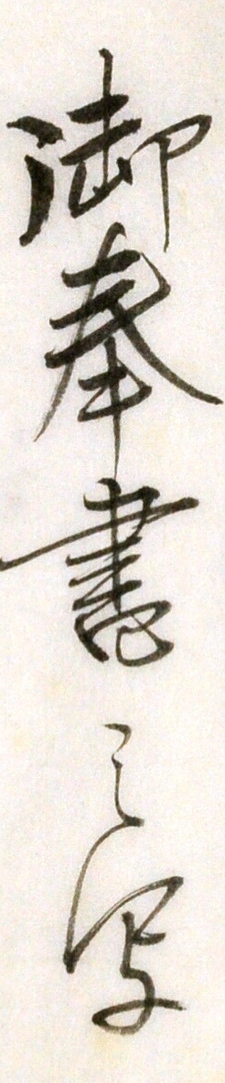御奉書之写

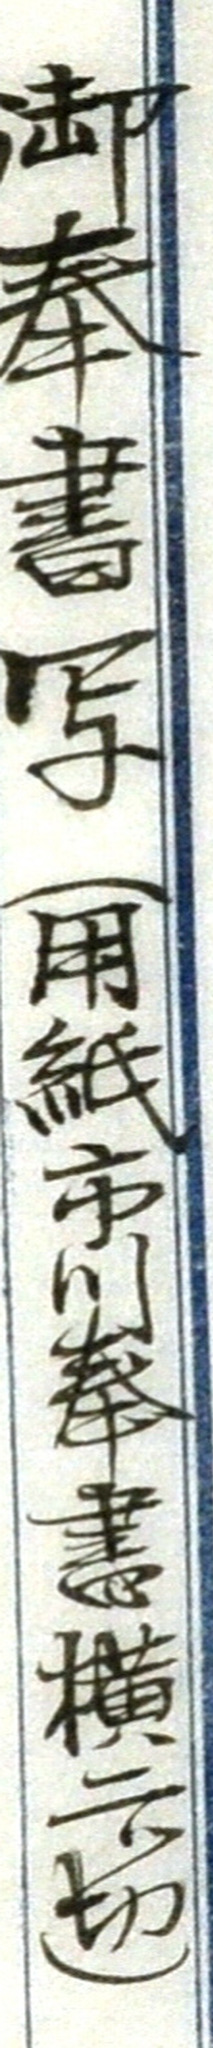御奉書写(用紙市川奉書横二ツ切)
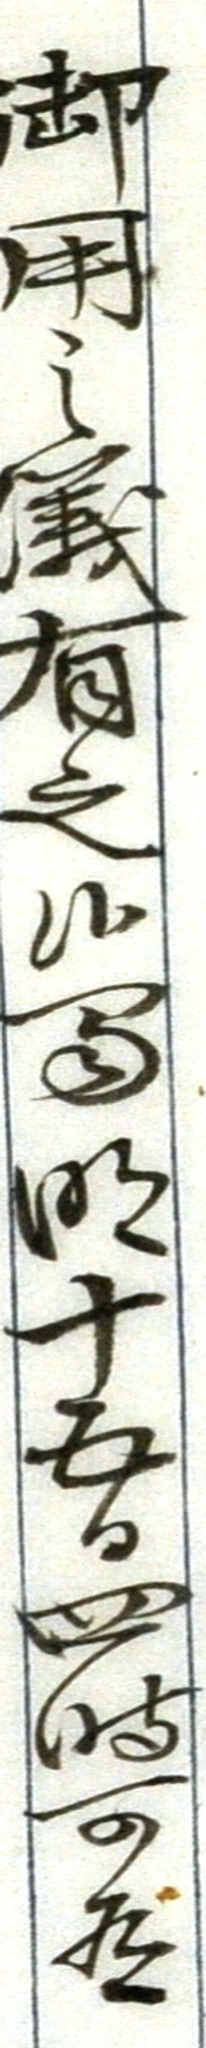御用之儀有之候間明十五日四時可有
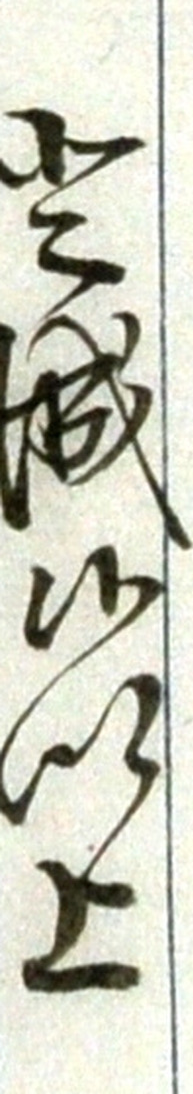登城候以上
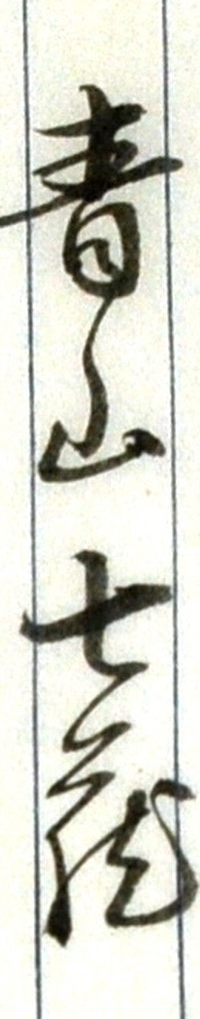青山七蔵
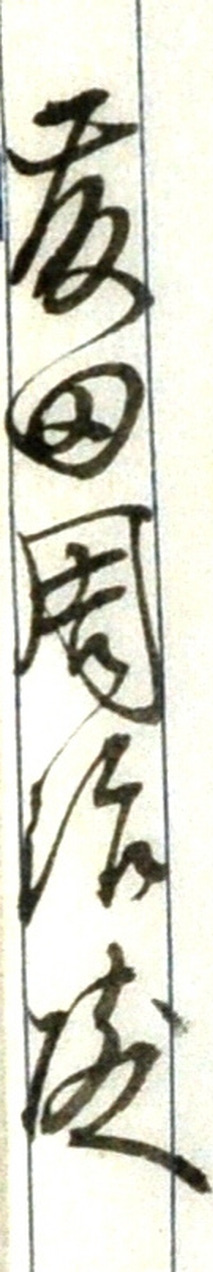藤田周治殿

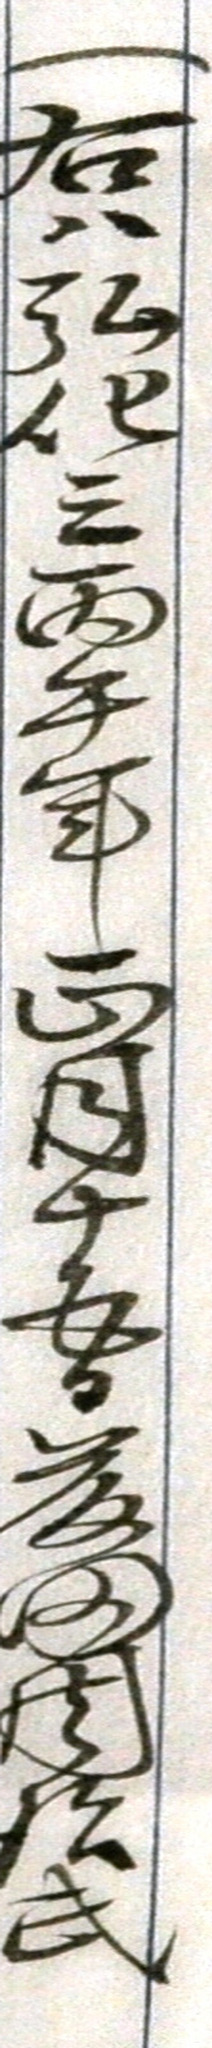(右ハ弘化三丙午年正月十五日藤田周治氏
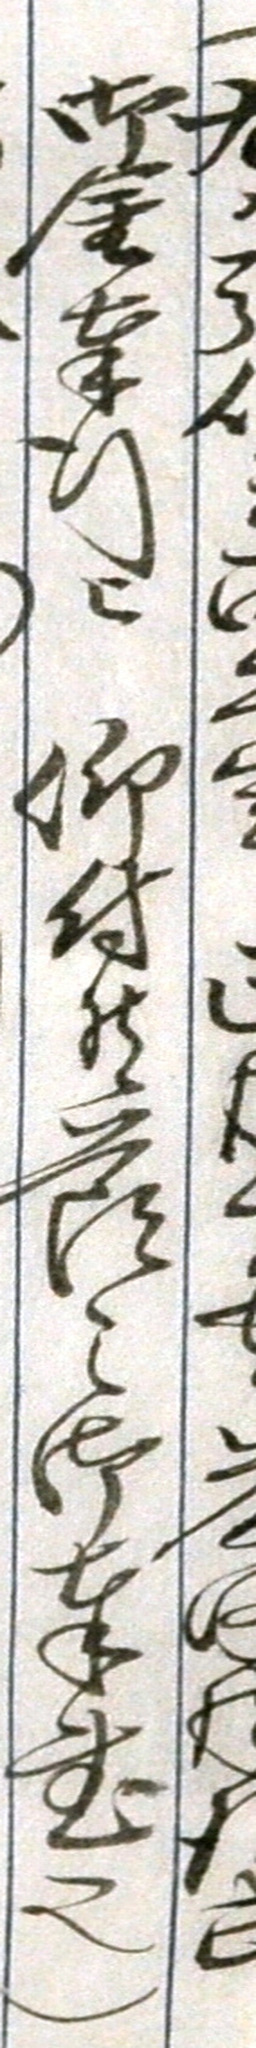御金奉行被仰付候節之御奉書也)
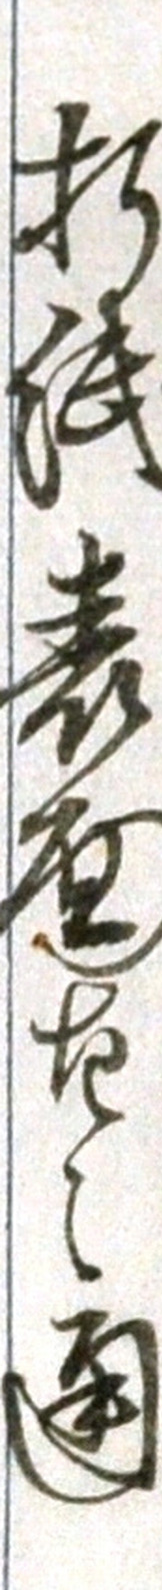折紙表面左之通
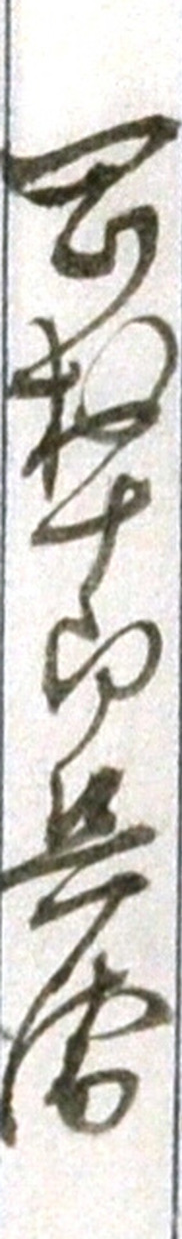岡村十郎兵衛
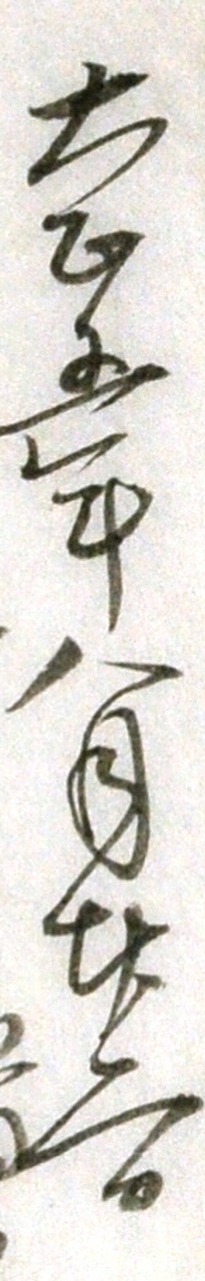大正五年八月廿二日
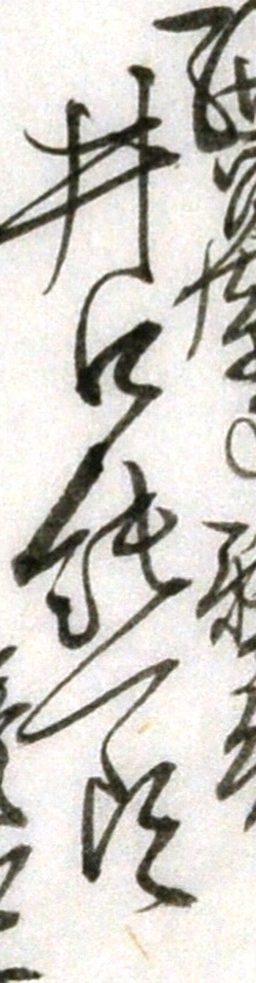井口純一郎
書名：御奉書之写
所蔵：伊那市立高遠町図書館・合同会社AMANE
